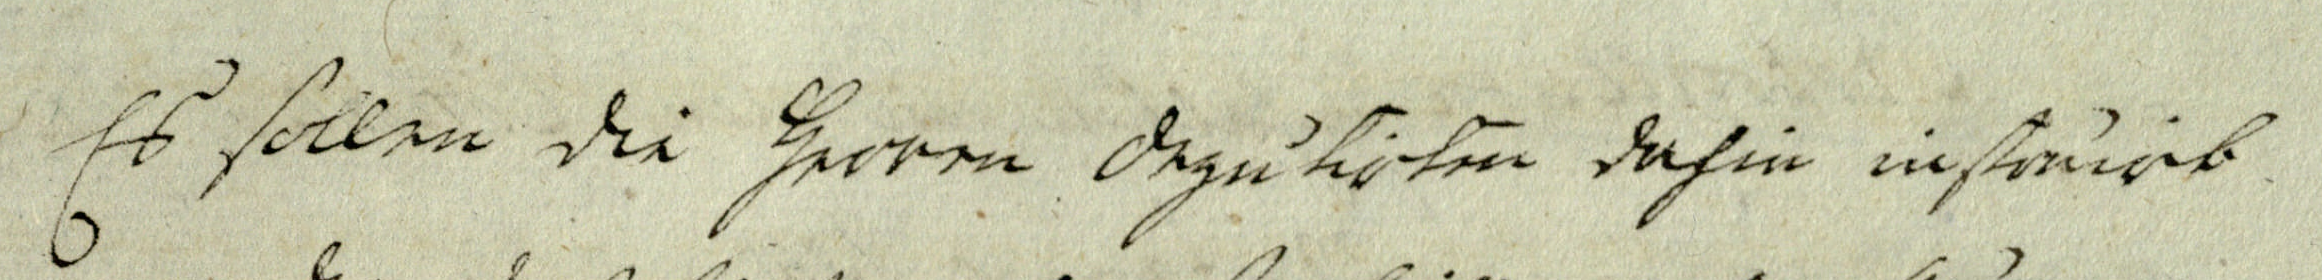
Es sollen die Herren Deputirten dahin instruiret
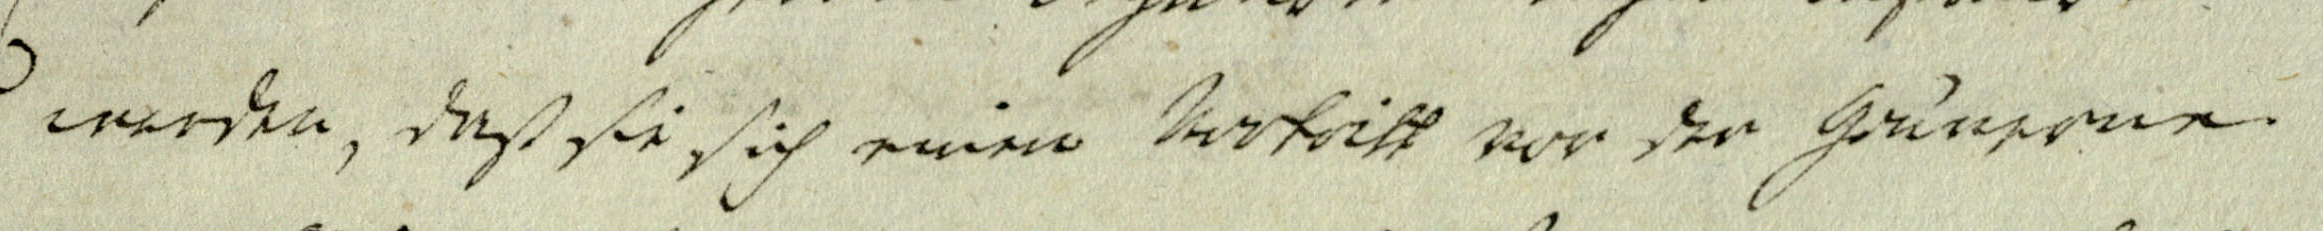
werden, daß sie sich einen Vortritt vor der Gouverne¬
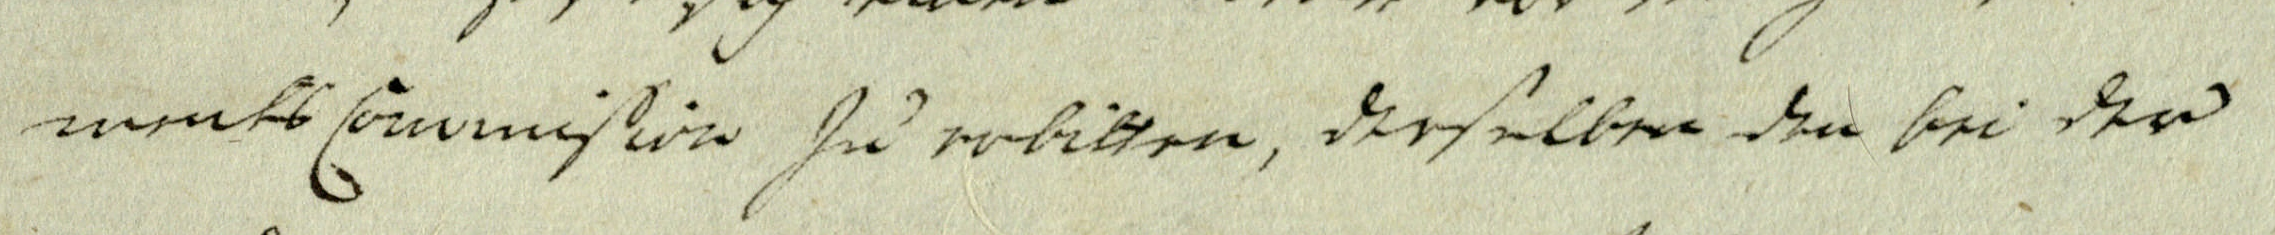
ments Commission zu erbitten, derselben den bei der
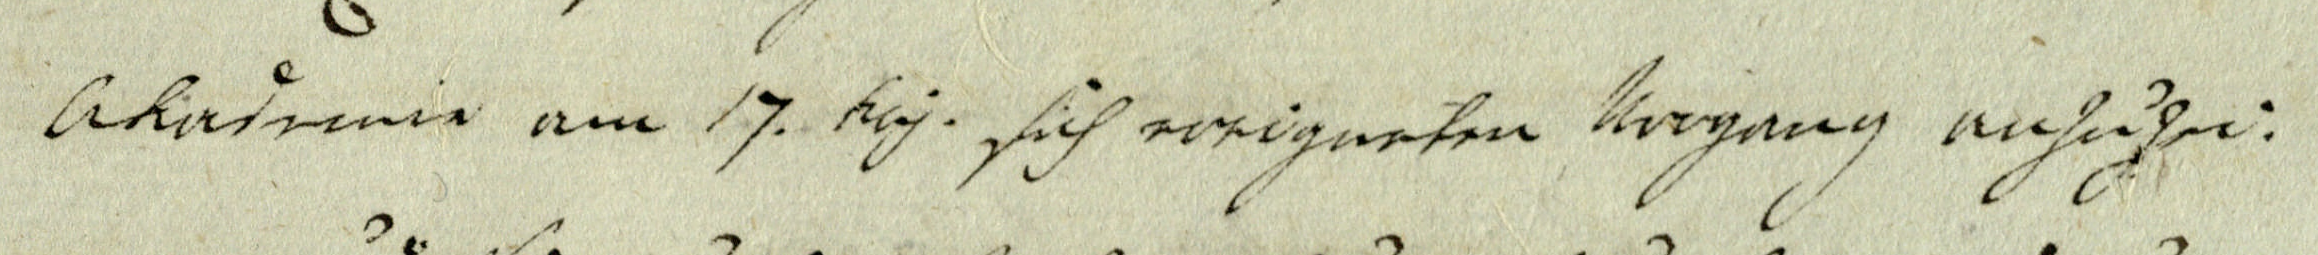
Akademie am 17. huj. sich ereigneten Vorgang anzuzei¬
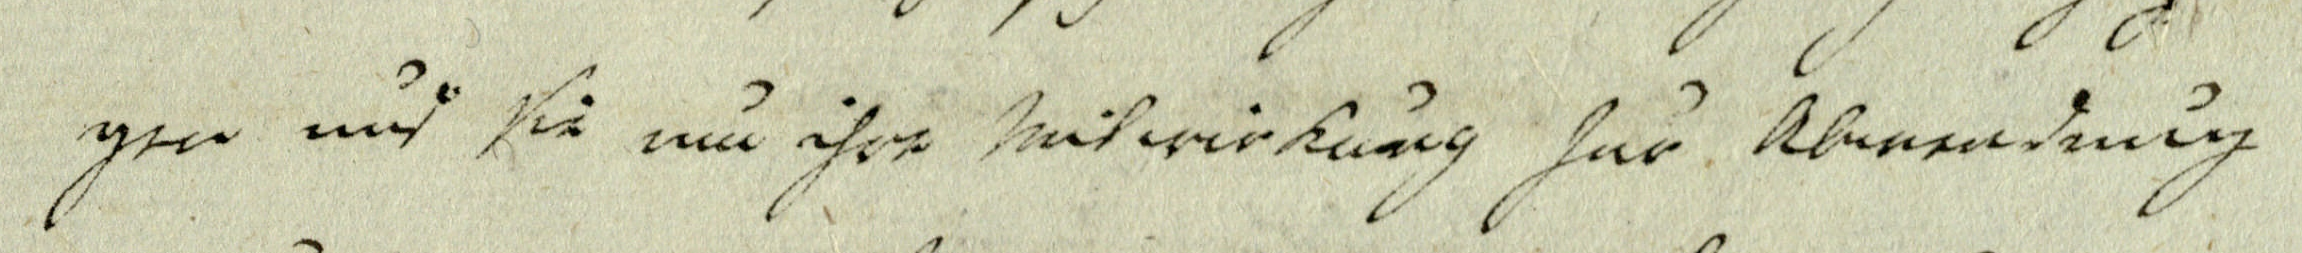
gen und sie um ihre Mitwirkung zur Abwendung
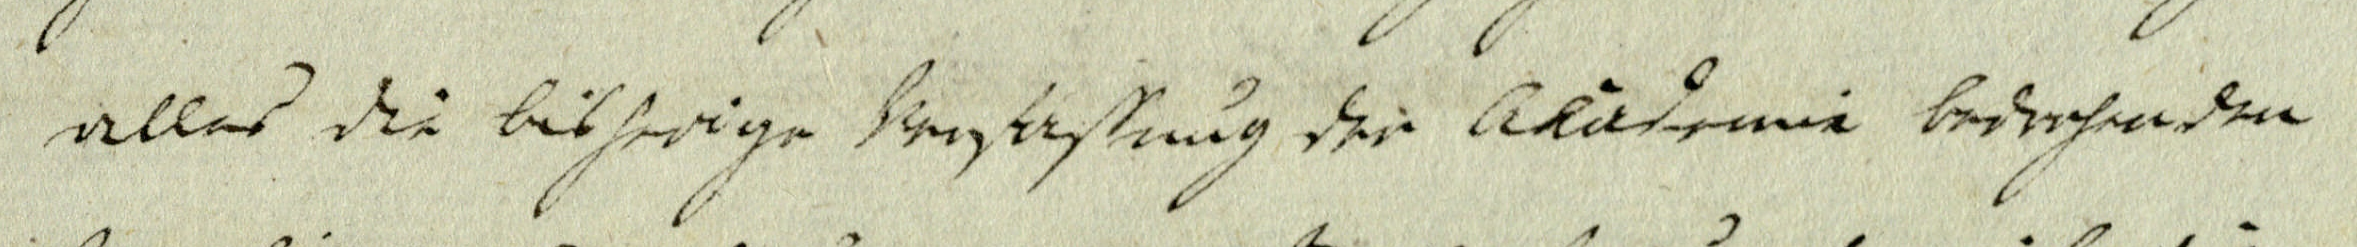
alles die bisherige Verfassung der Akademie bedrohenden
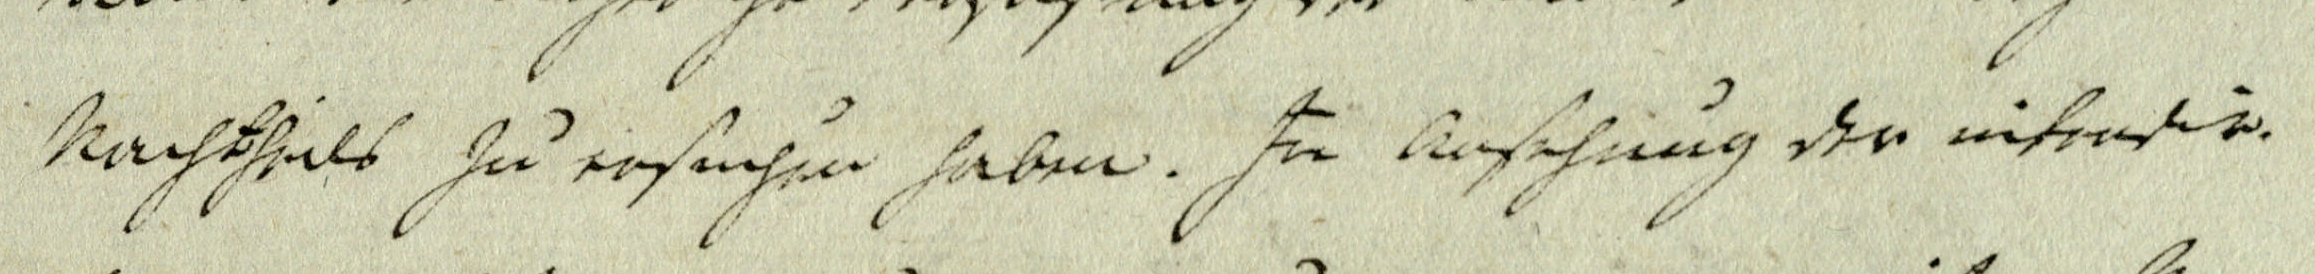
Nachtheils zu ersuchen haben. In Ansehung der intendir¬
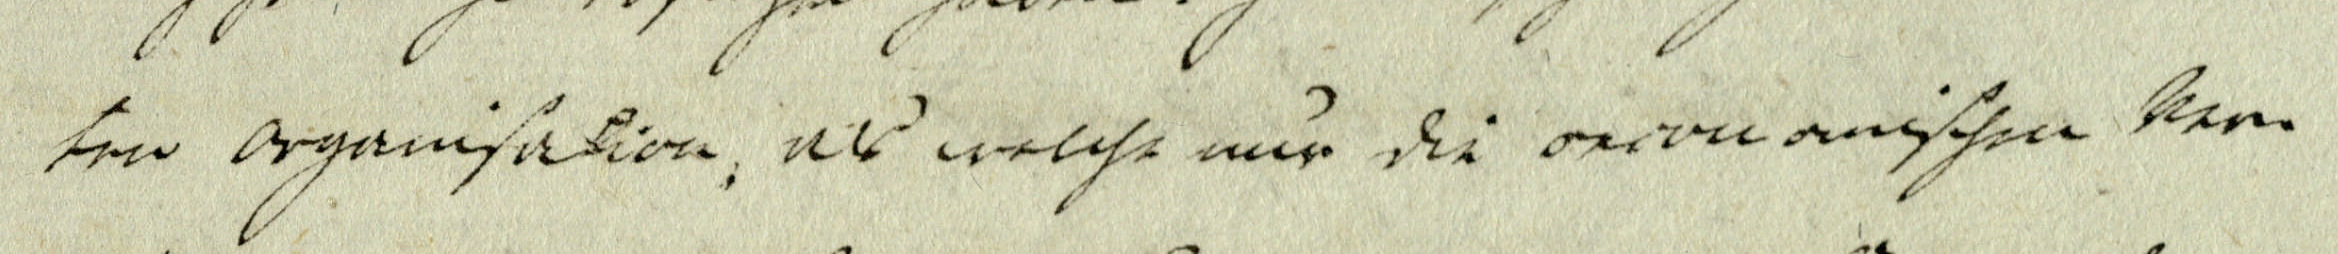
ten Organisation, als welche nur die oeconomischen Ver¬
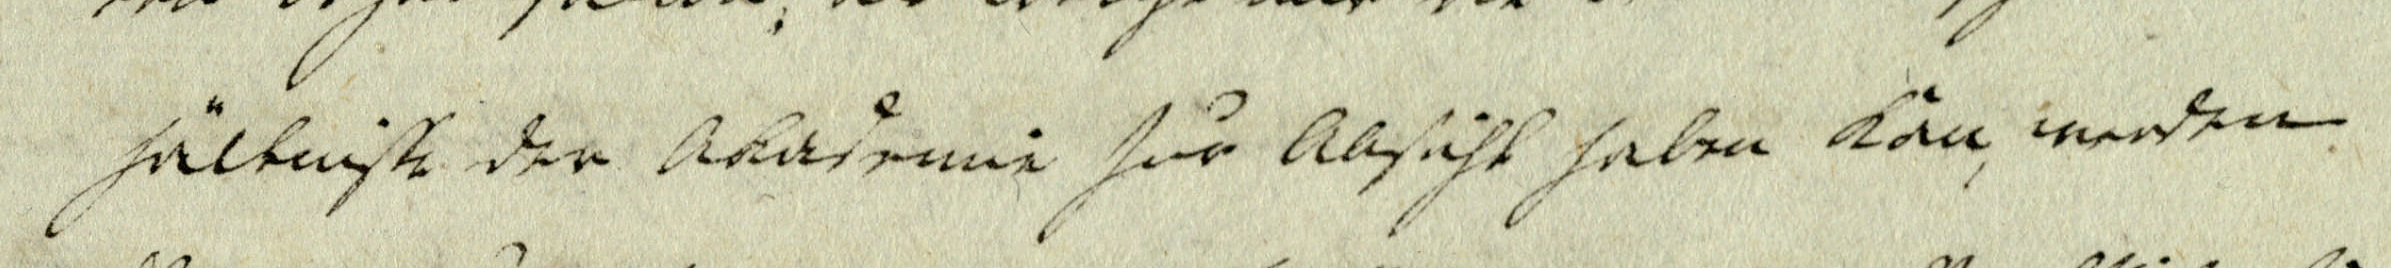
hältisse der Akademie zur Absicht haben kan, werden
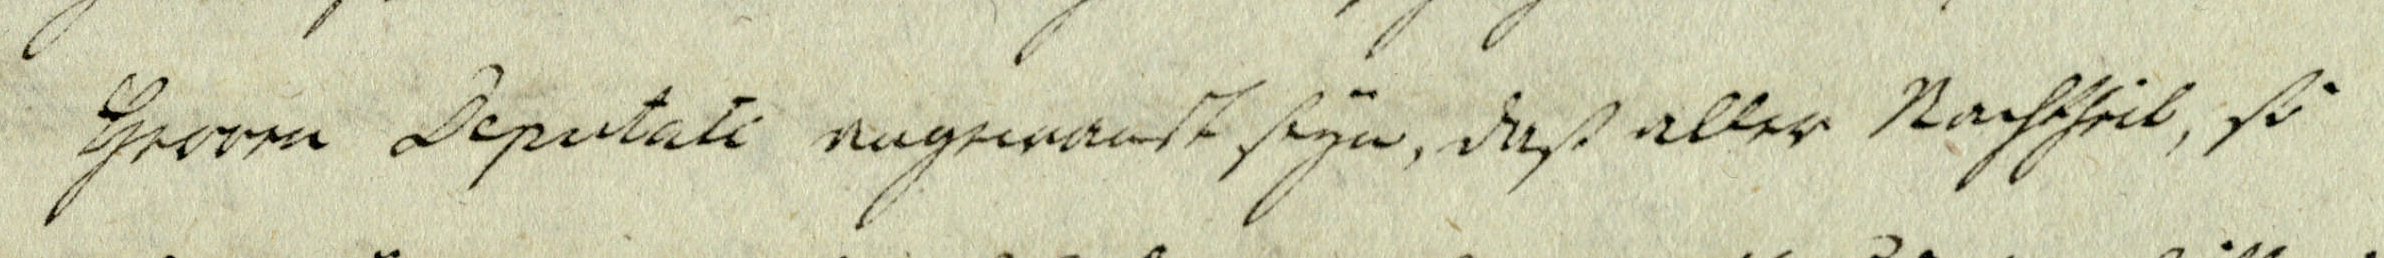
Herren Deputati angewandt seÿn, daß aller Nachtheil, so
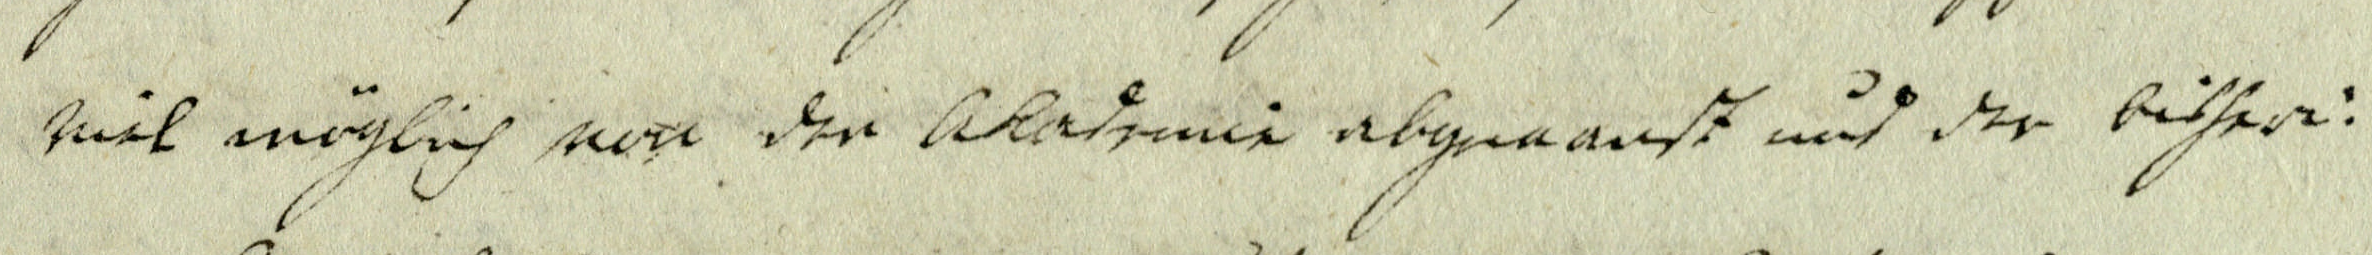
viel möglich von der Akademie abgewandt und der bisheri¬
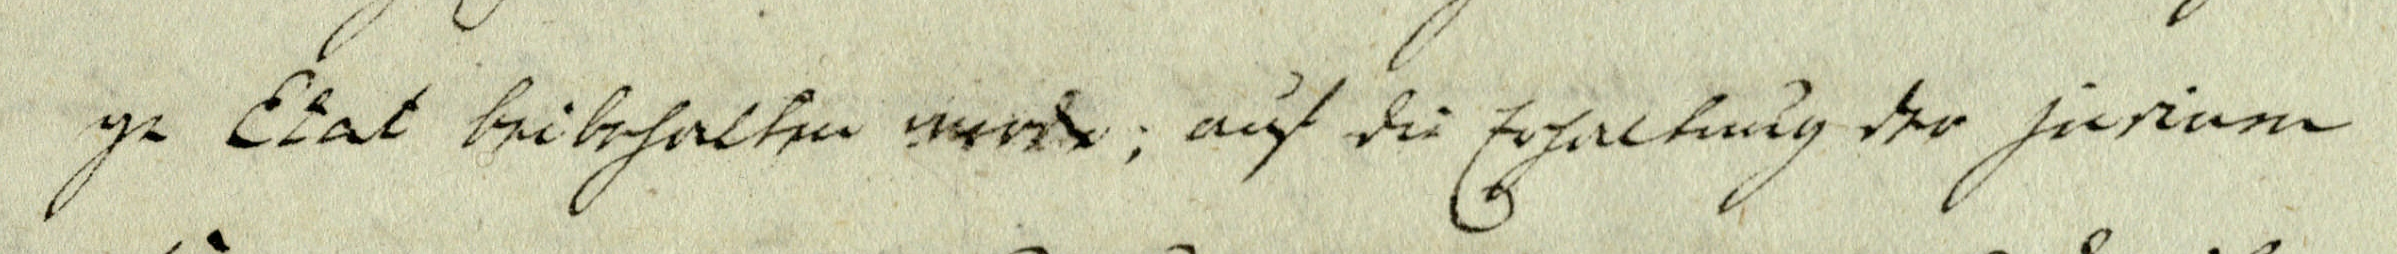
ge Etat beibehalten werde; auf die Erhaltung der jurium
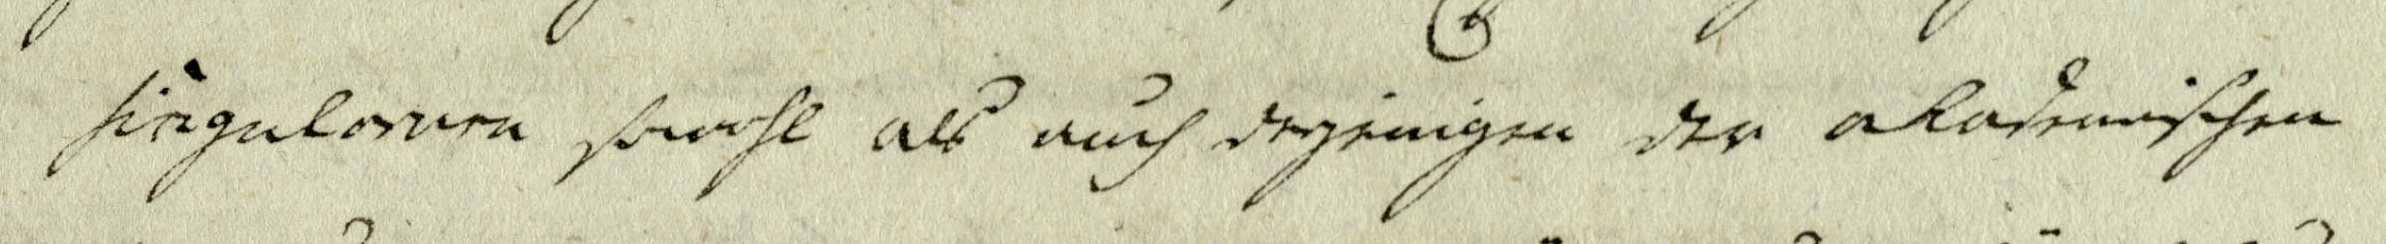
singulorum sowohl als auch derjenigen der akademischen
